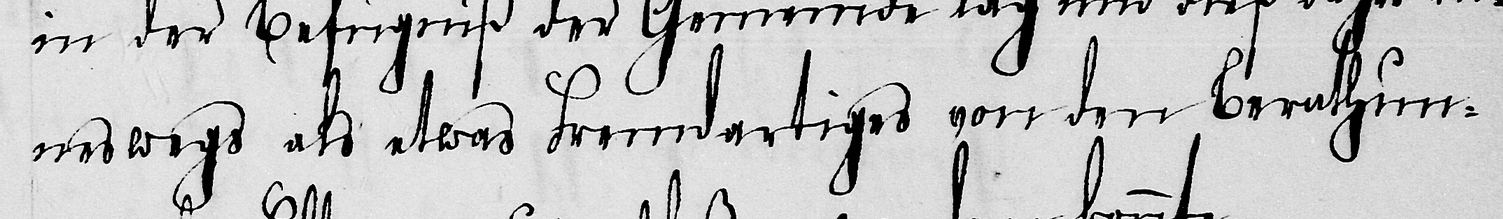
neswegs als etwas Fremdartiges von den Berathun¬
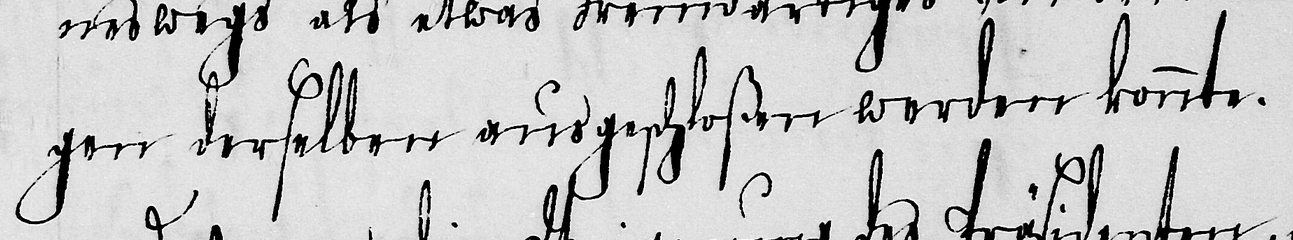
gen derselben ausgeschloßen werden könnte.
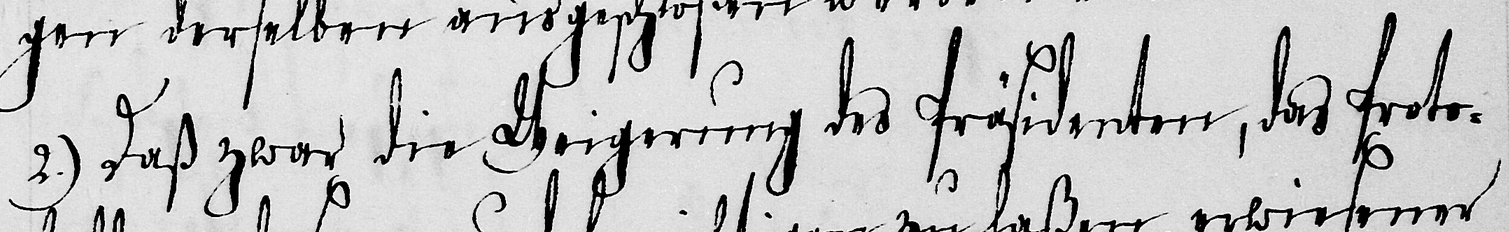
2.) Daß zwar die Weigerung des Präsidenten, das Proto¬
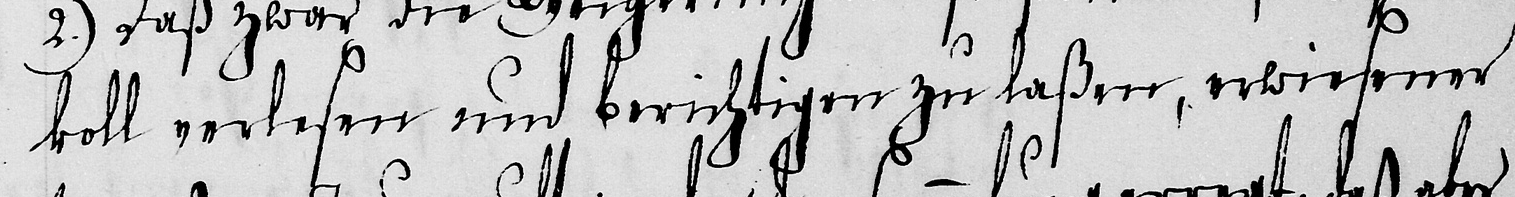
koll verlesen und berichtigen zu laßen, erwiesener
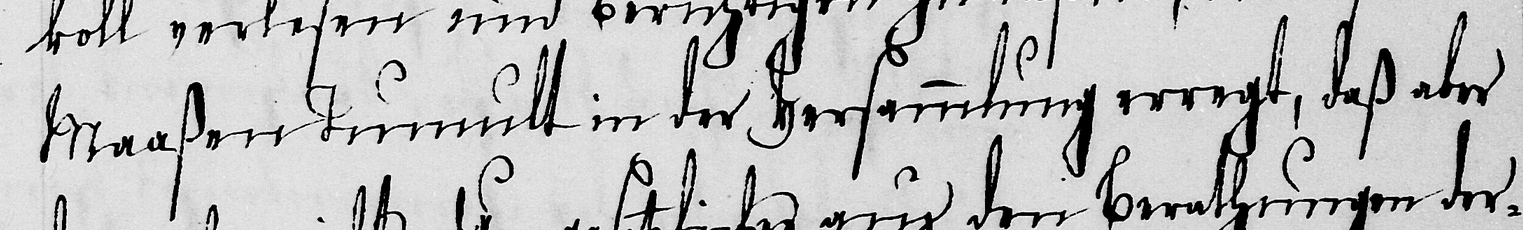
Maaßen Tumult in der Versammlung erregt, daß aber
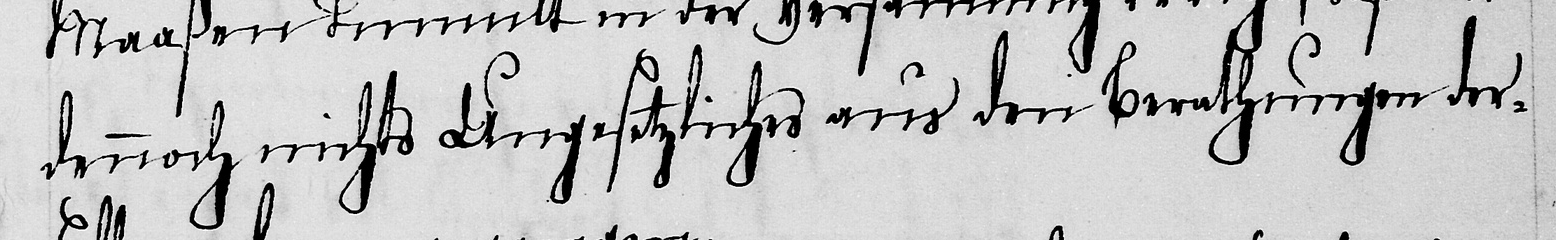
dennoch nichts Ungesetzliches aus den Berathungen der¬
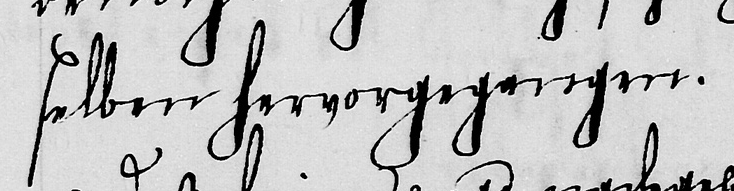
selben hervorgegangen.
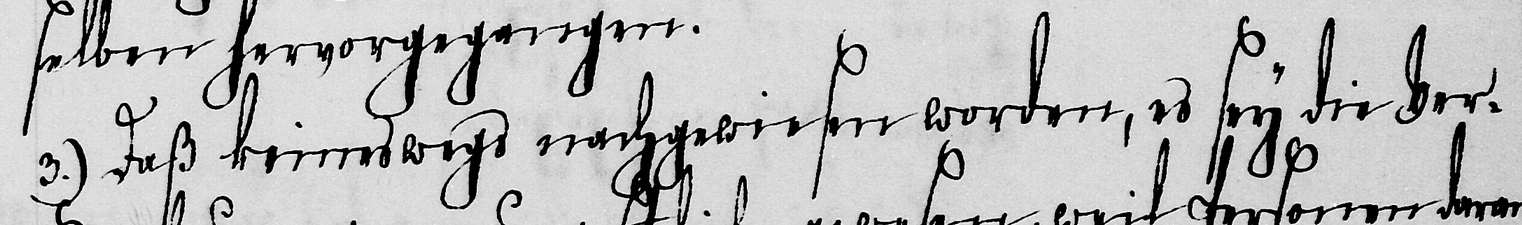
3.) Daß keineswegs nachgewiesen worden, es sey die Ver¬
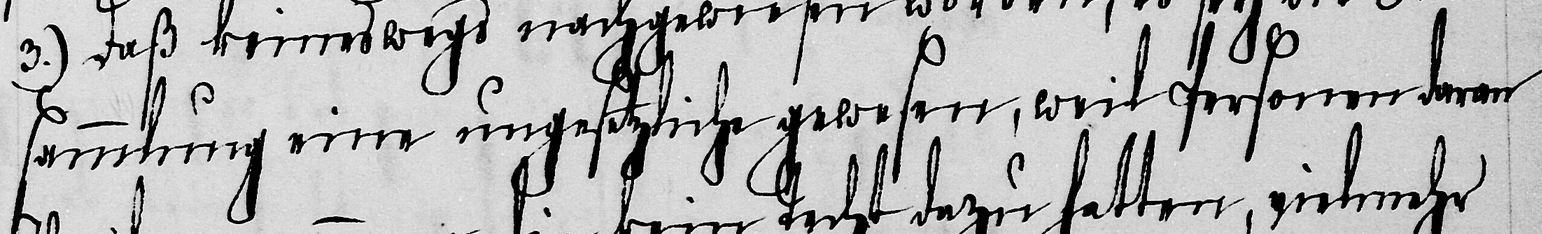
sammlung eine ungesetzliche gewesen, weil Personen daran
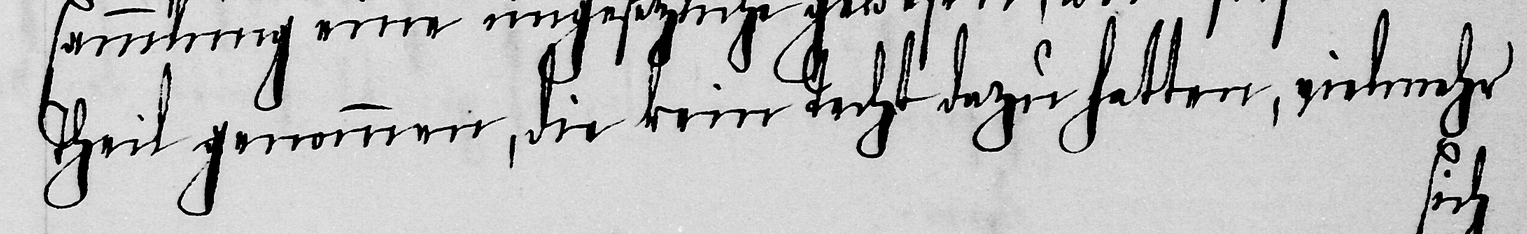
Theil genommen, die kein Recht dazu hatten, vielmehr
